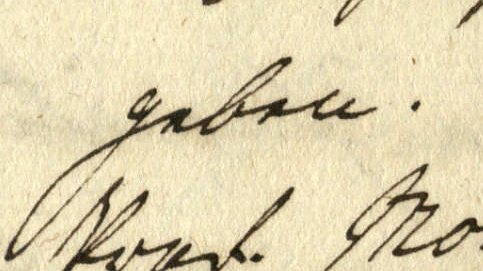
geben.
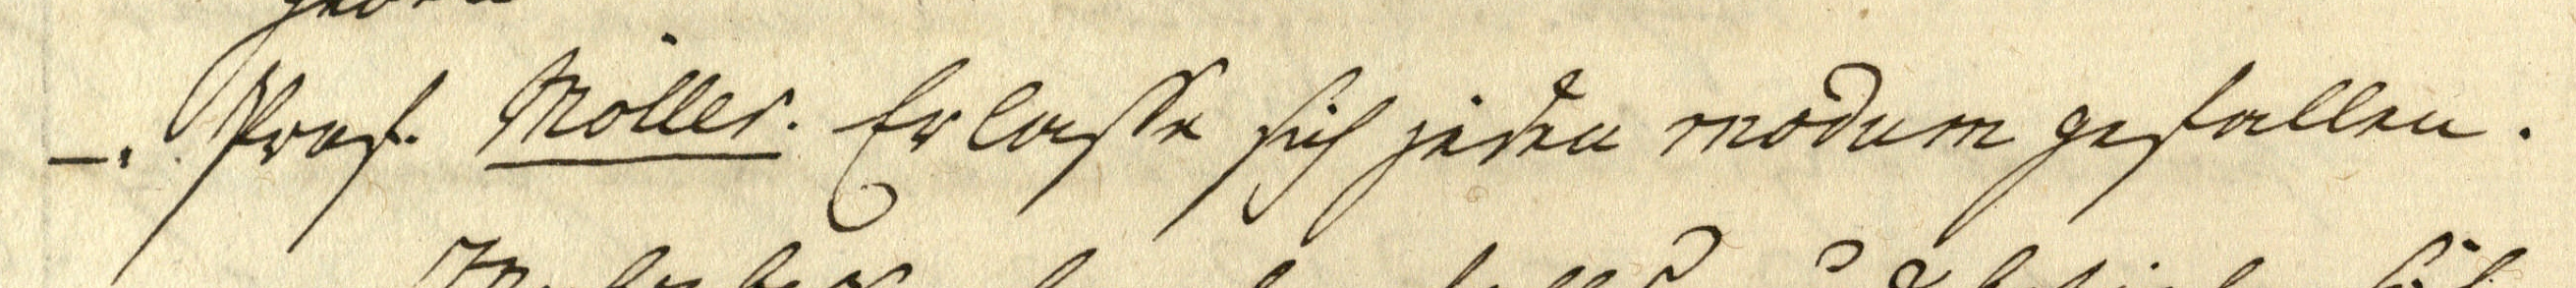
- " Prof. Möller. Er lasse sich jeden modum gefallen.
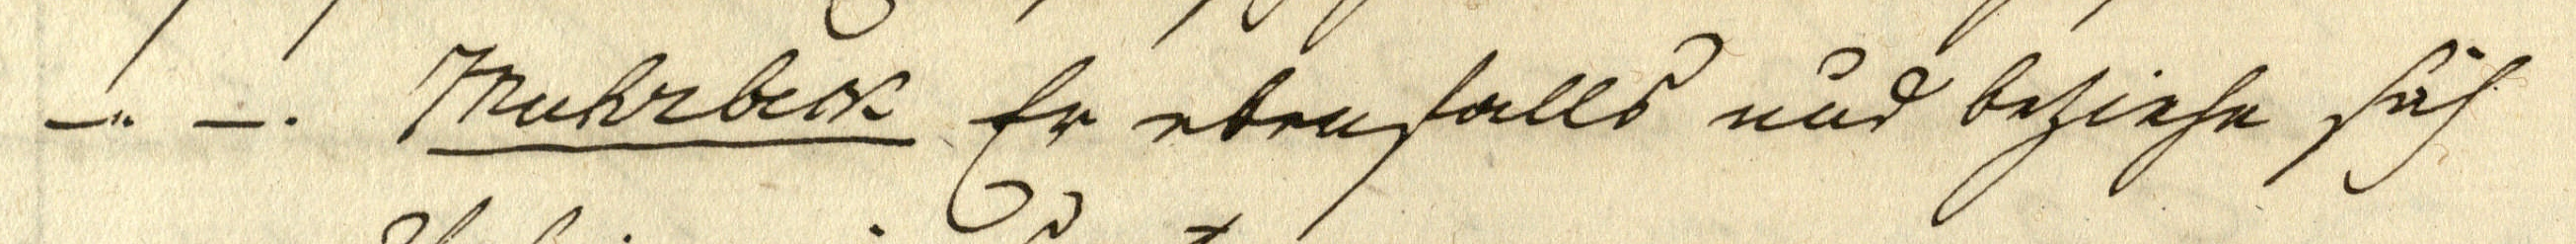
- " - . Muhrbeck Er ebenfalls und beziehe sich
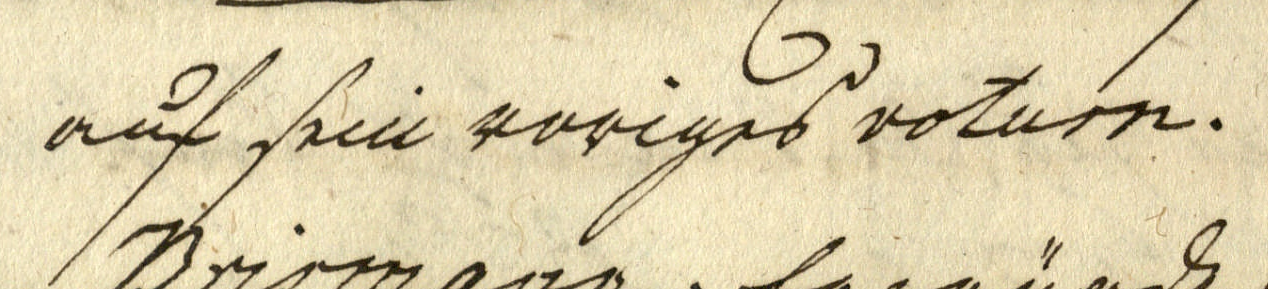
auf sein voriges votum.
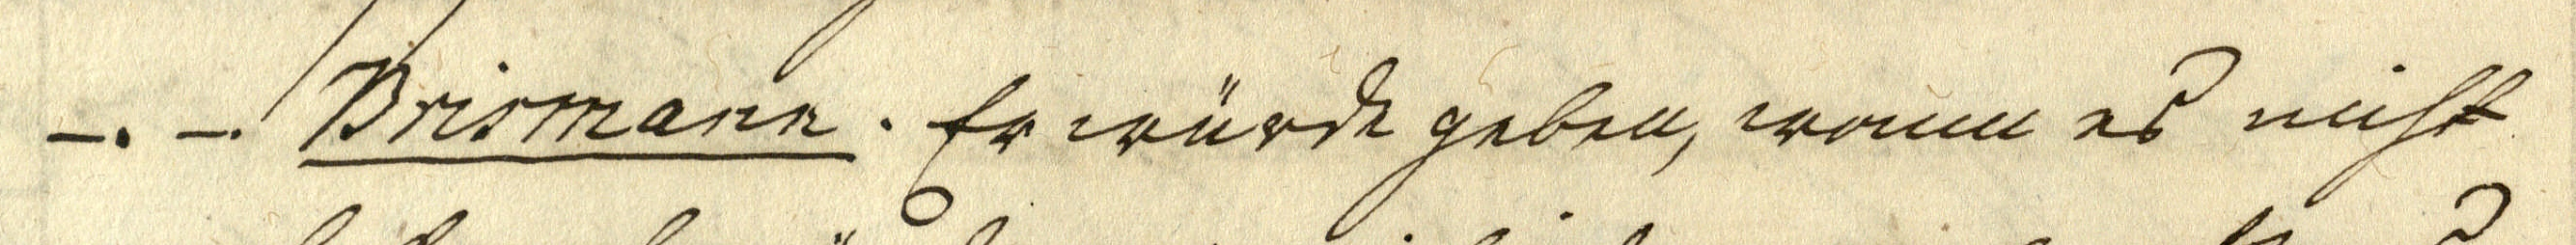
- " - . Brismann. Er würde geben, wann es nicht
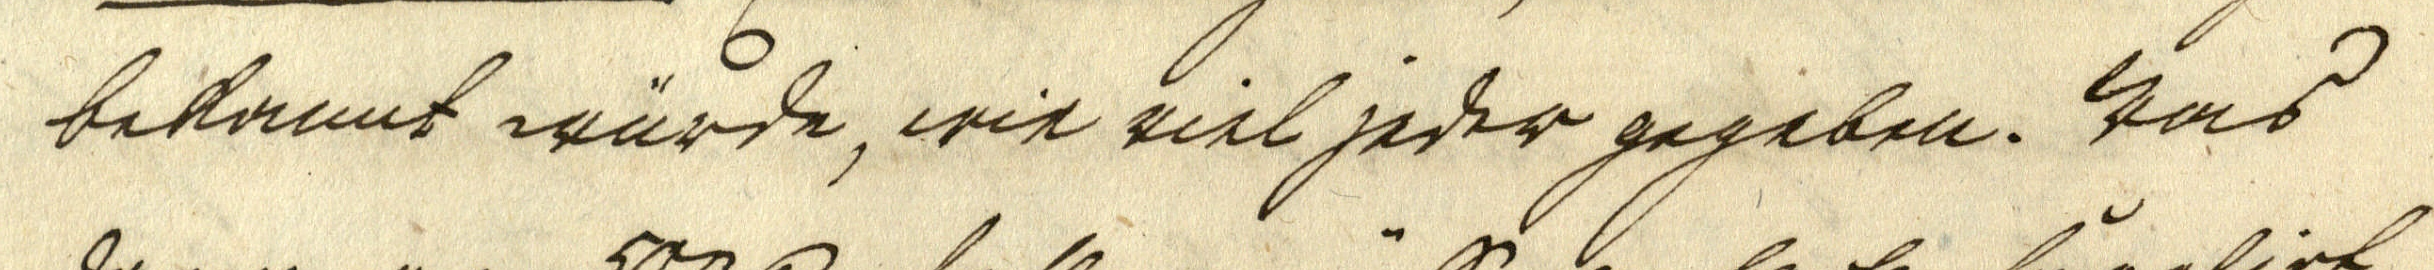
bekannt würde, wie viel jeder gegeben. Was
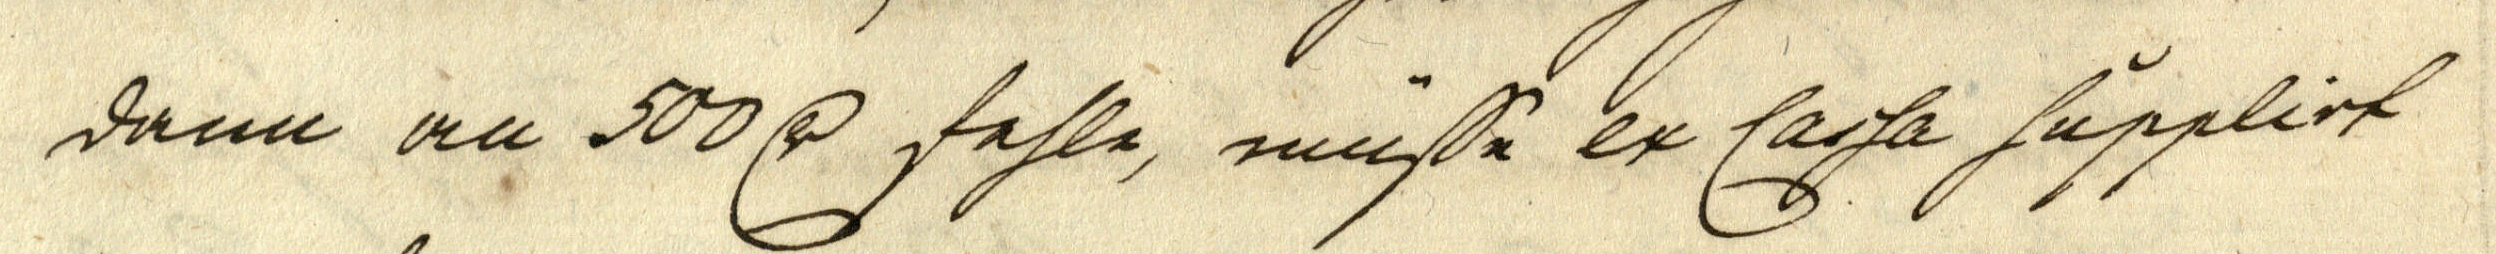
dann an 500 rtl. fehle, müsse ex Cassa supplirt
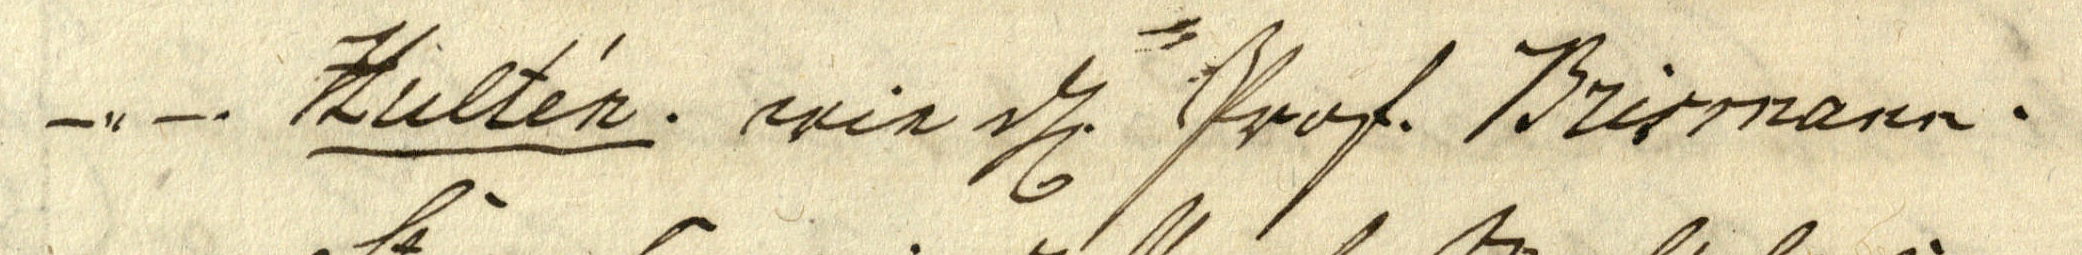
- " - . Hultén. wie dh. Prof. Brismann.
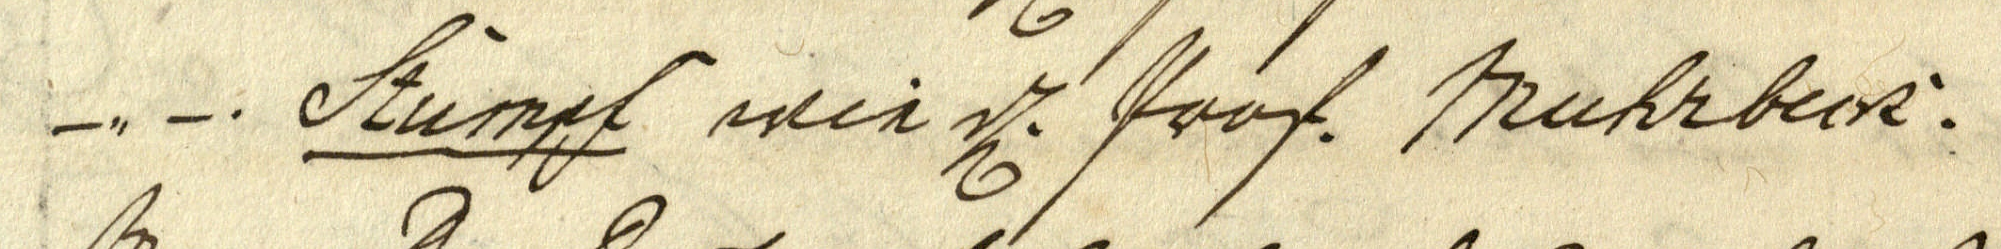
- " - . Stumpf wie dh. Prof. Muhrbeck.
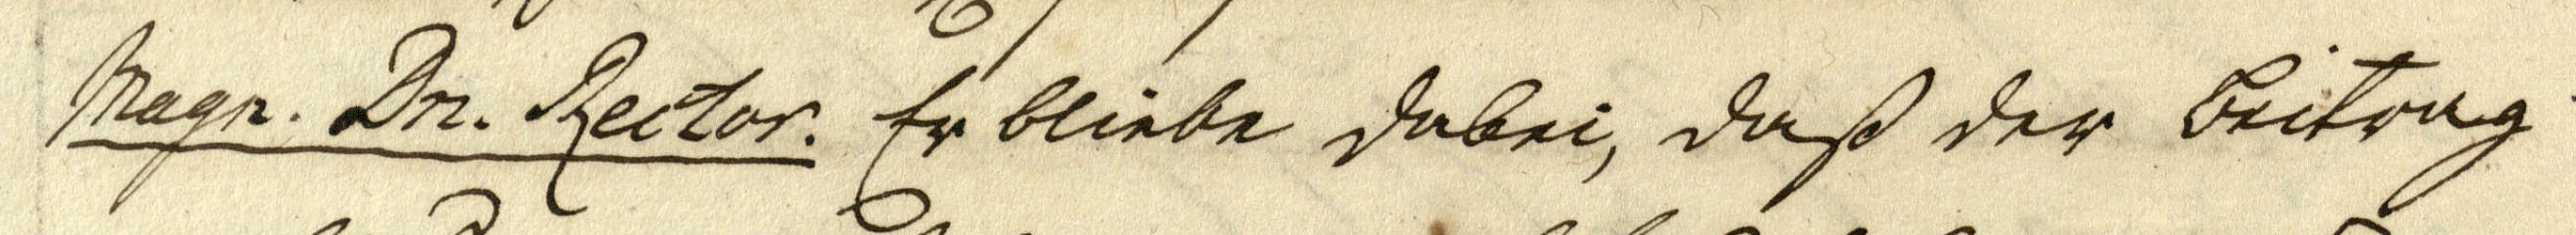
Magn. Dn. Rector. Er bliebe dabei, daß der Beitrag
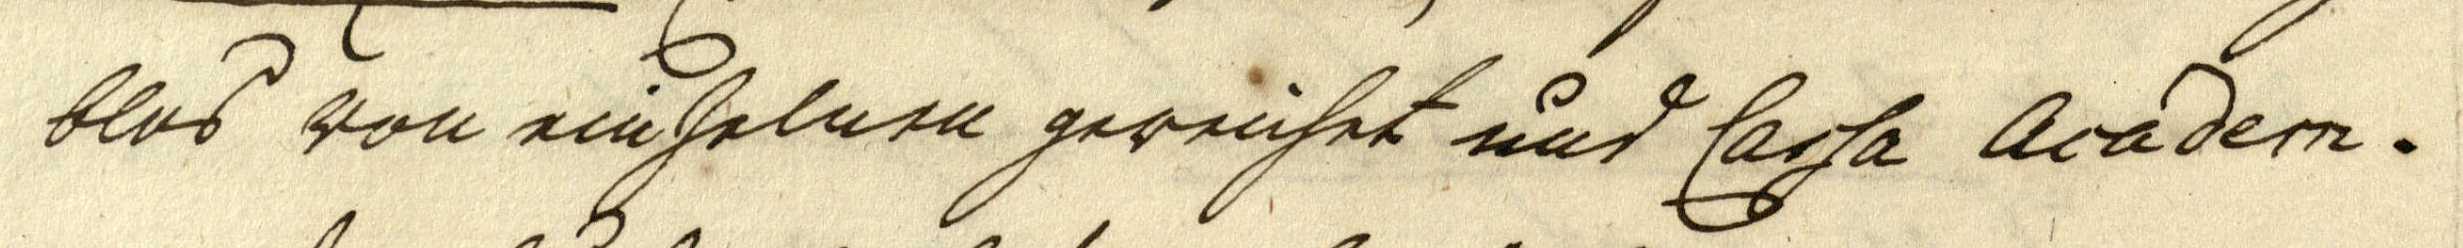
blos von einzelnen gereichet und Cassa Academ.
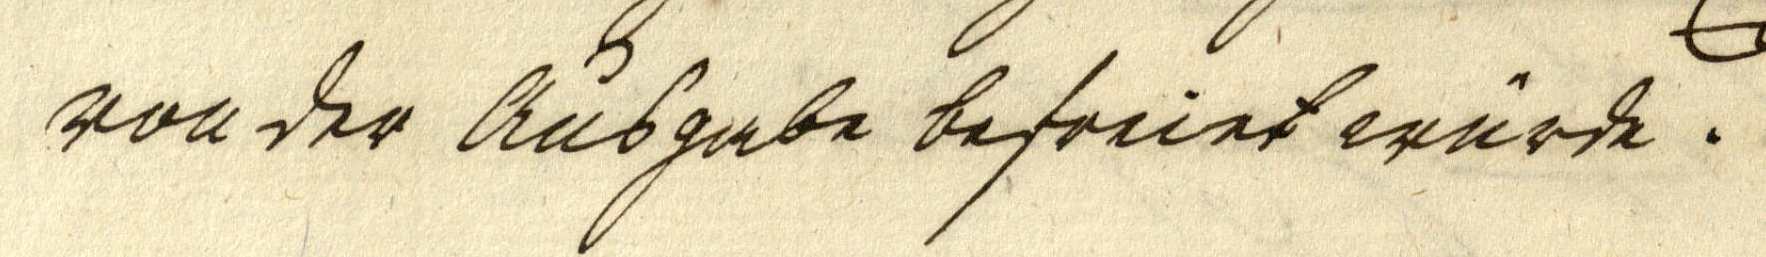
von der Ausgabe befreiet würde.
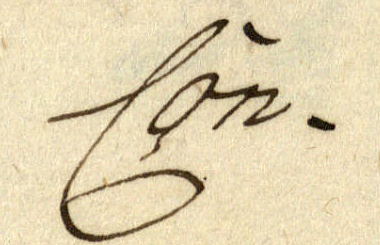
Con-
